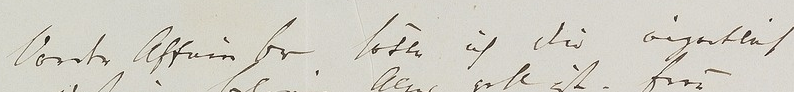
Vor der Affaire Br hätte ich dir eigentlich
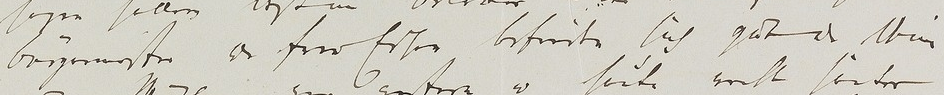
Bürgermeister u. Frau Escher befinden sich gut u. Deine
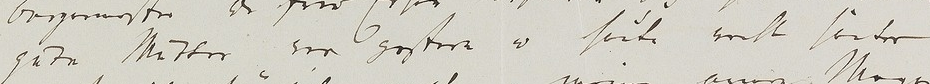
gute Mutter war gestern u. heute recht heiter
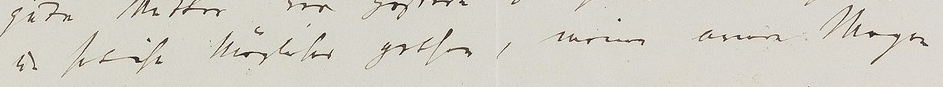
u. hat ihr Mögliches gethan, meinen armen Magen
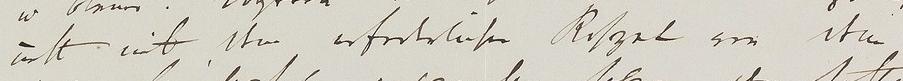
nicht mit dem erforderlichen Respet von dem
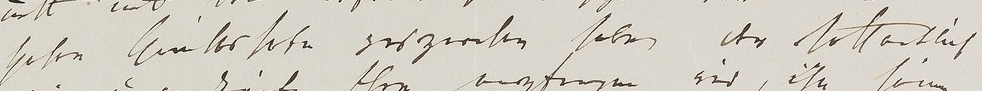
hohen Gerichtshofe gesprochen habe, der hoffentlich
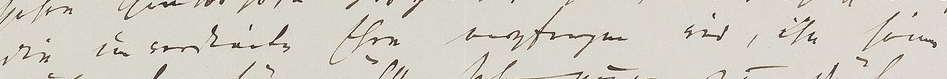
die unverdiente Ehre empfangen wird, ihn seinen
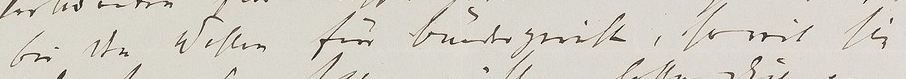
Bei den Wahlen fürs Bundesgericht, so weit sie
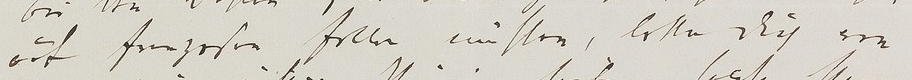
auf Franzosen fallen müssen, lasse Dich von
